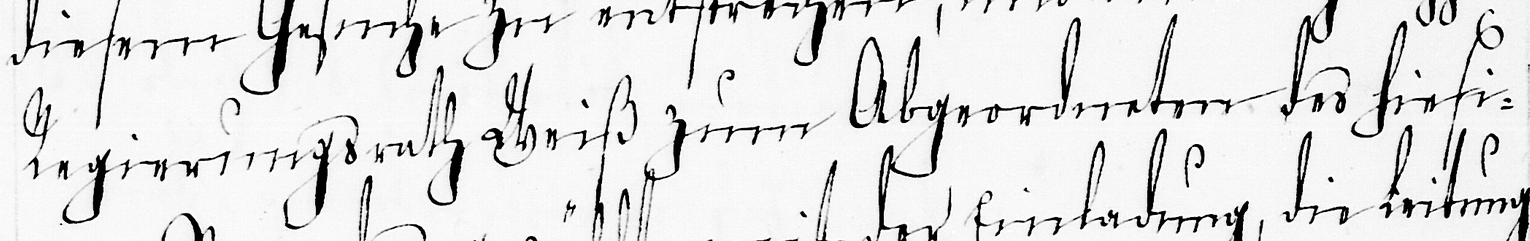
Regierungsrath Weiß zum Abgeordneten des hiesi¬
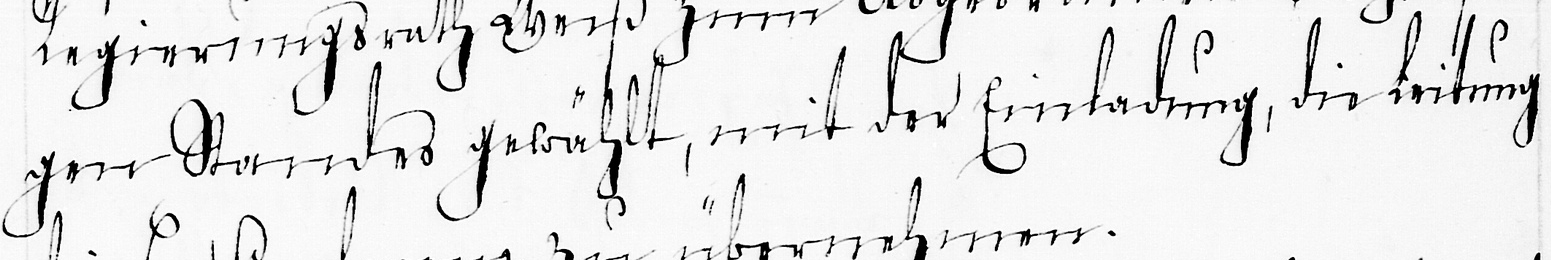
gen Standes gewählt, mit der Einladung, die Leitung
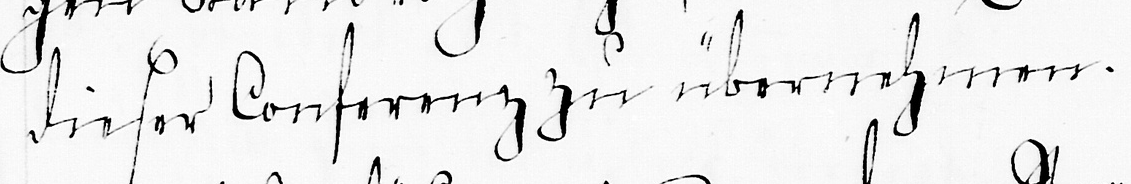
dieser Conferenz zu übernehmen.
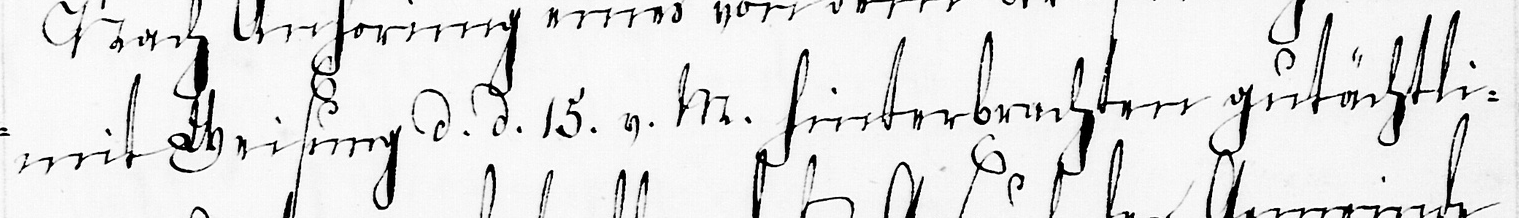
mit Weisung d. d. 15. v. M. hinterbrachten gutächtli¬
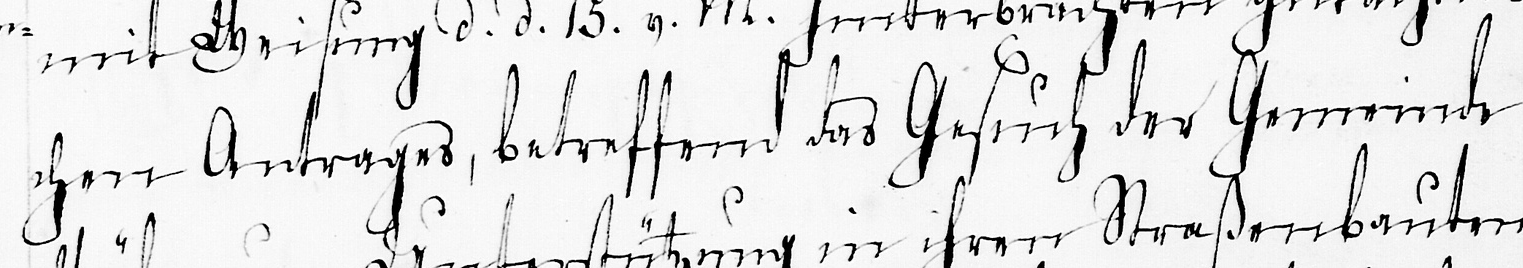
chen Antrages, betreffend das Gesuch der Gemeinde
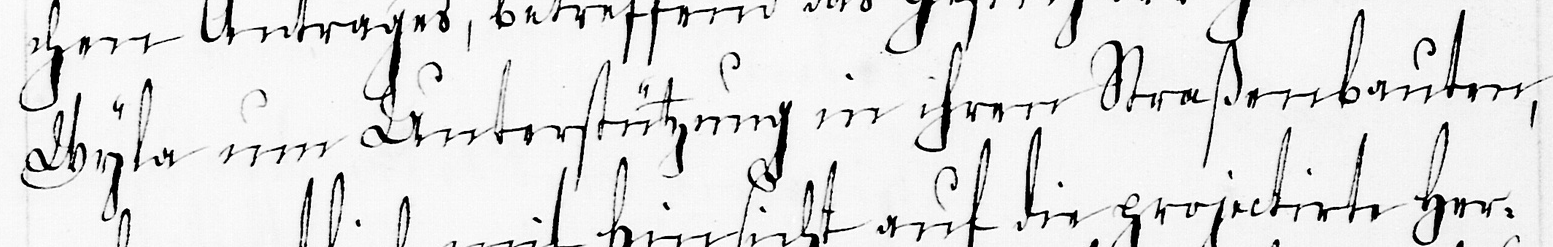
Wyla um Unterstützung in ihren Straßenbauten,
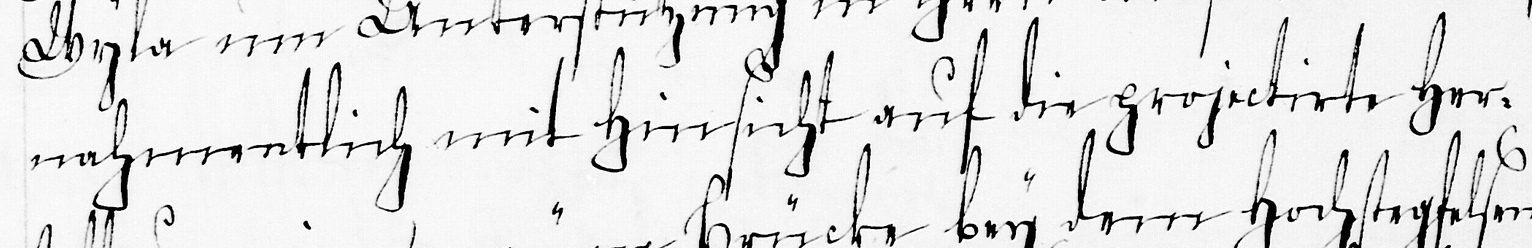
nahmentlich mit Hinsicht auf die projectirte Her¬
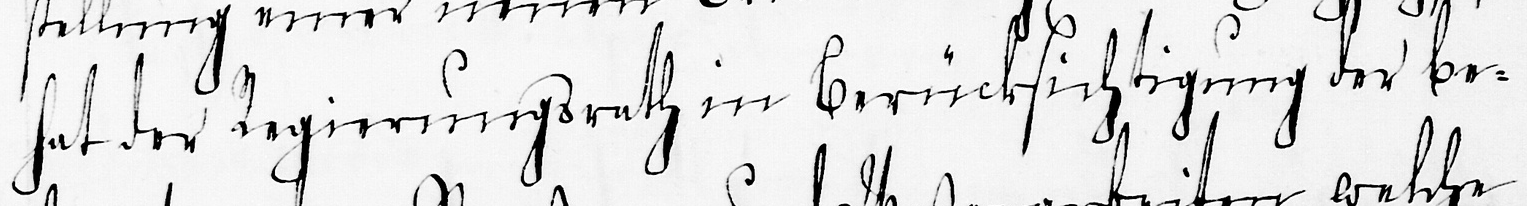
hat der Regierungsrath in Berücksichtigung der be¬
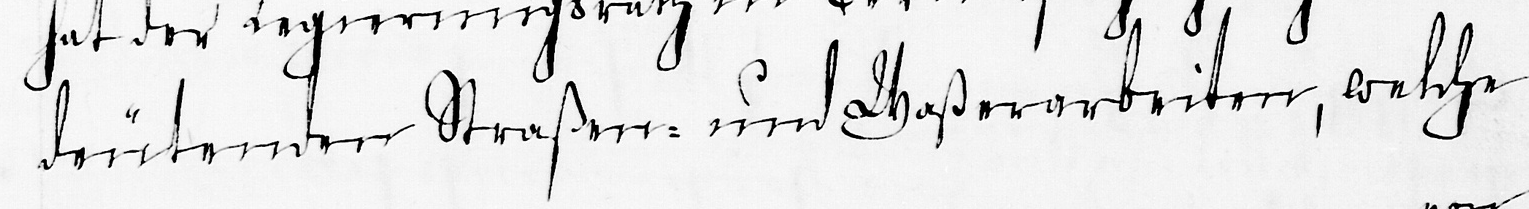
deutenden Straßen- und Waßerarbeiten, welche
